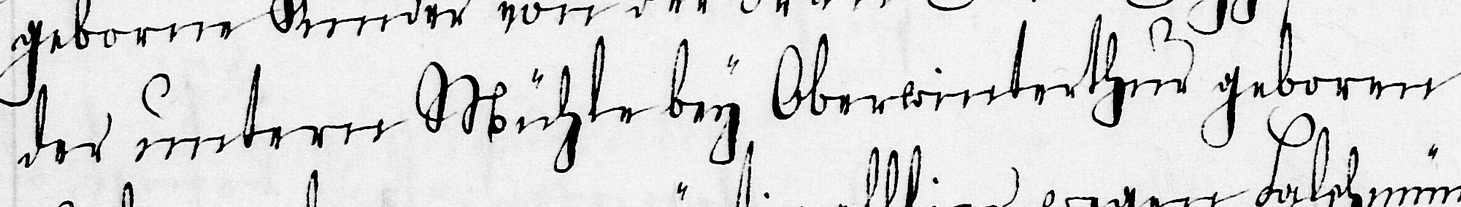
der untern Mühle bey Oberwinterthur geboren
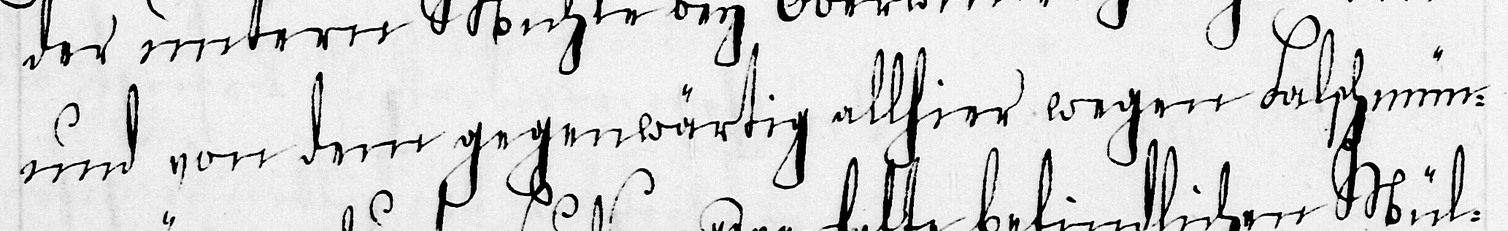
und von dem gegenwärtig allhier wegen Falschmün¬
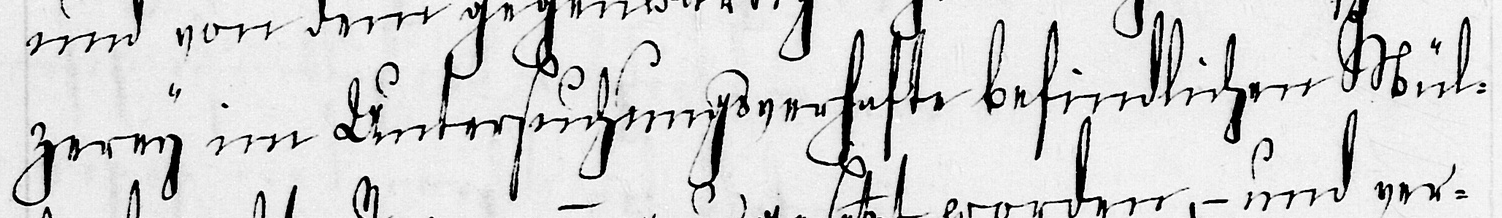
zerey im Untersuchungsverhafte befindlichen Mül¬
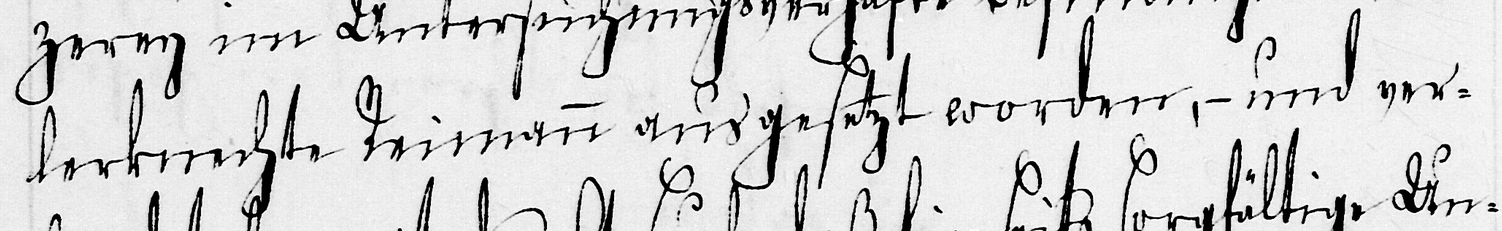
lerknechte Reimann ausgesetzt worden, – und ver¬
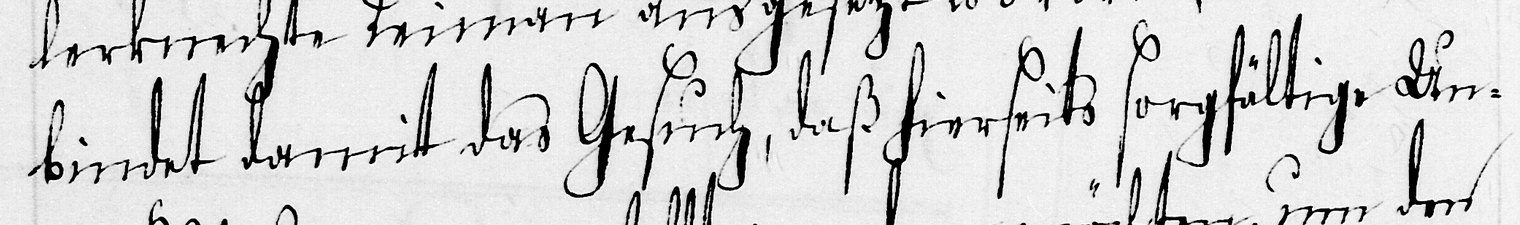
bindet damit das Gesuch, daß hierseits sorgfältige Un¬
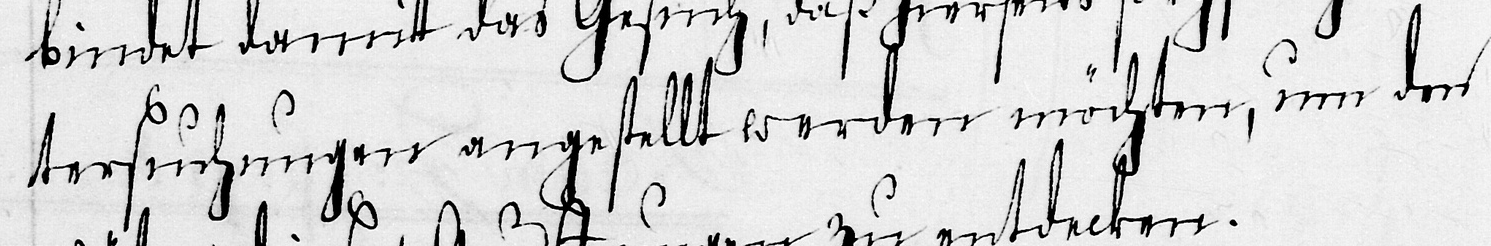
tersuchungen angestellt werden möchten, um den
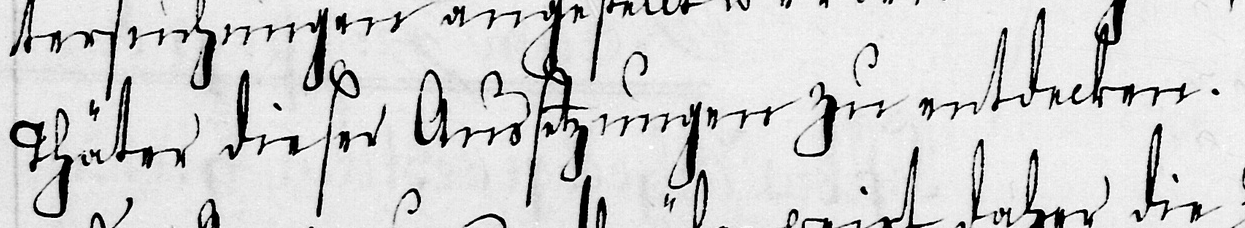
Thäter dieser Aussetzungen zu entdecken.
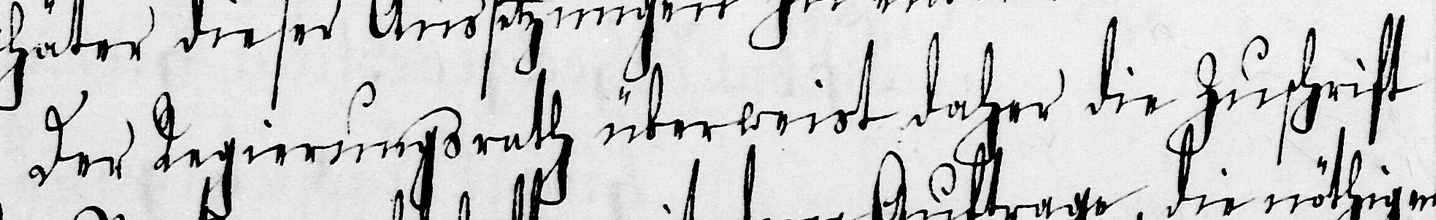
Der Regierungsrath überweist daher die Zuschrift
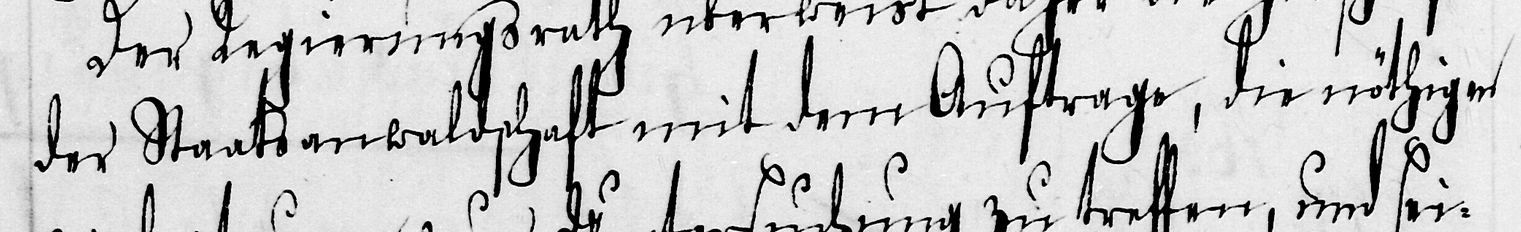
der Staatsanwaldschaft mit dem Auftrage, die nöthigen
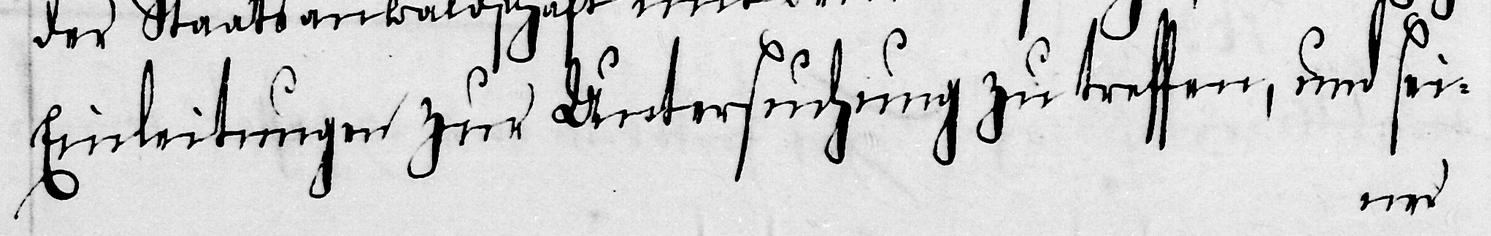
Einleitungen zur Untersuchung zu treffen, und sei-
